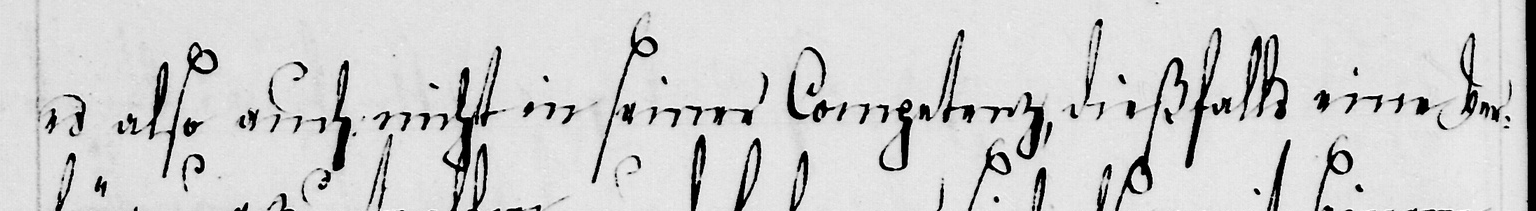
es also auch nicht seiner Competenz dießfalls eine Ve¬
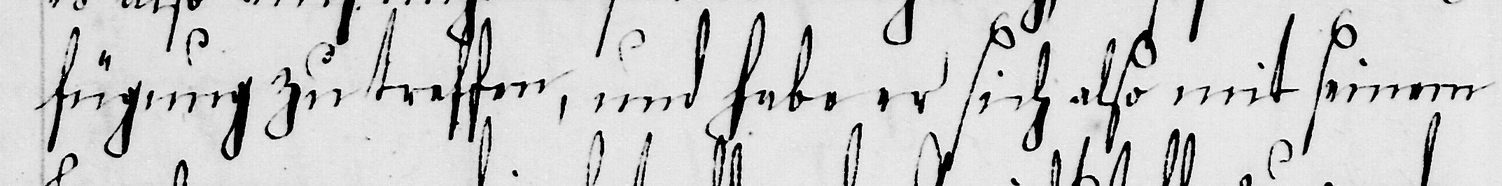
rfügung zu treffen, und habe er sich also mit seinem
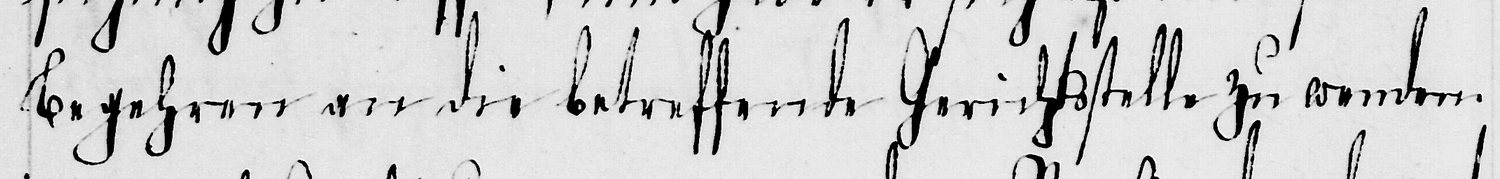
Begehren an die betreffende Gerichtsstelle zu wenden.
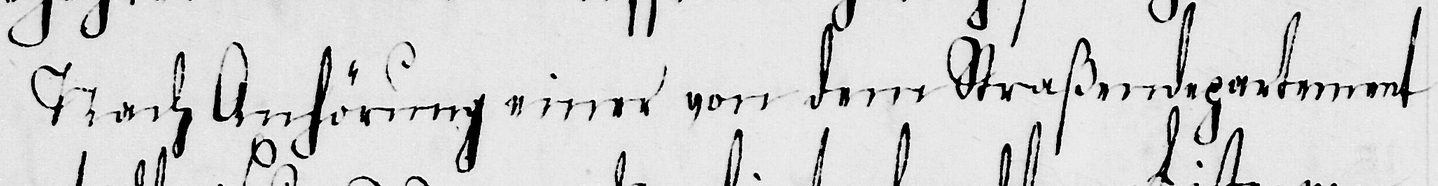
Nach Anhörung einer von dem Straßendepartement
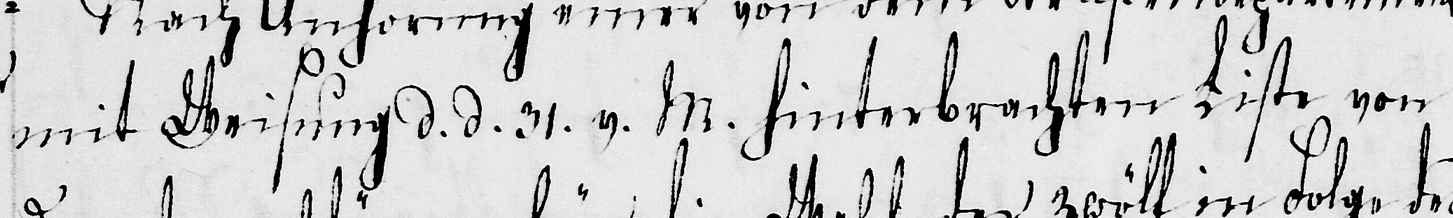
mit Weisung d. d. 31. v. M. hinterbrachten Liste von
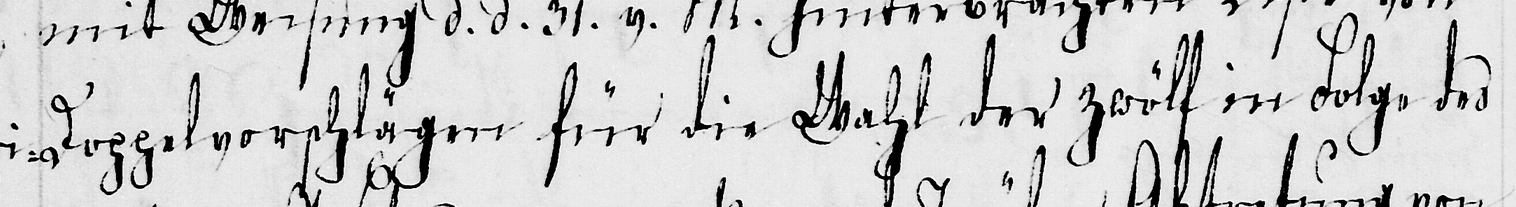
Doppelvorschlägen für die Wahl der zwölf in Folge des
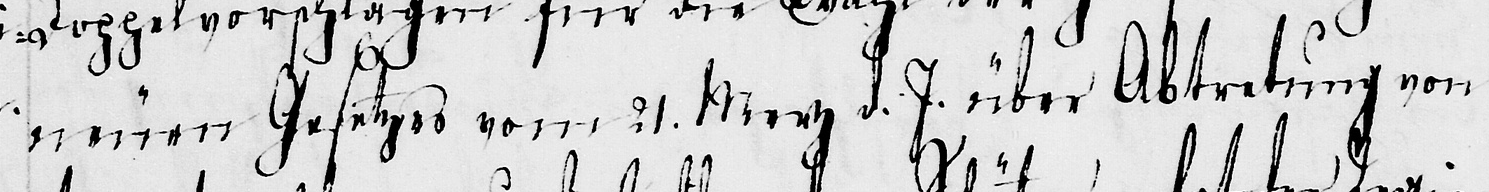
neuen Gesetzes vom 21. Merz d. J. über Abtretung von
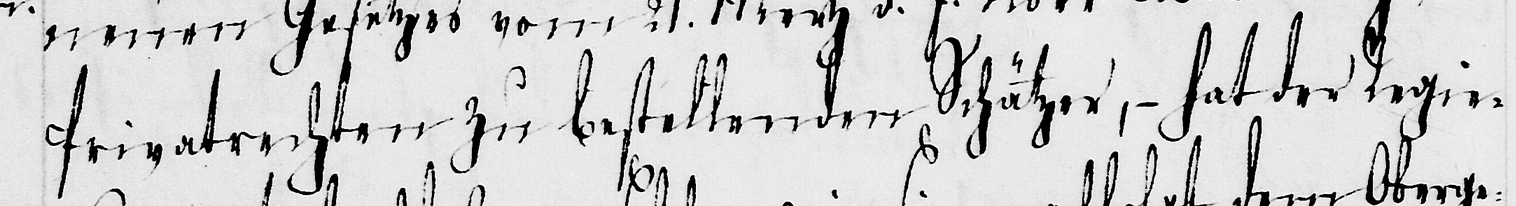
Privatrechten zu bestellenden Schätzer, – hat der Regie¬
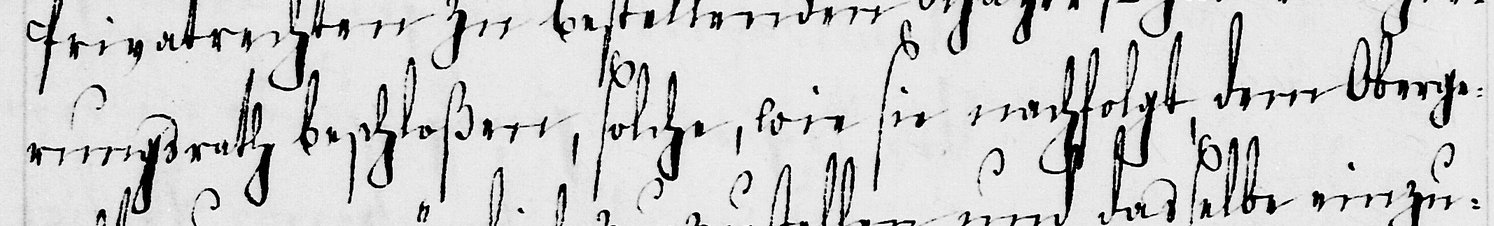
rungsrath beschloßen, solche, wie sie nachfolgt, dem Oberg¬
